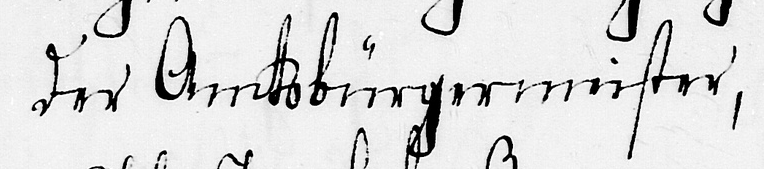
Der Amtsbürgermeister,
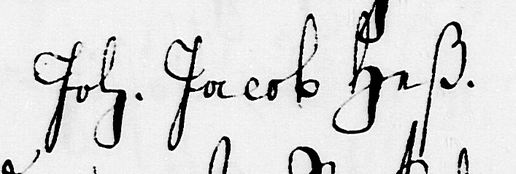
Joh. Jacob Heß.
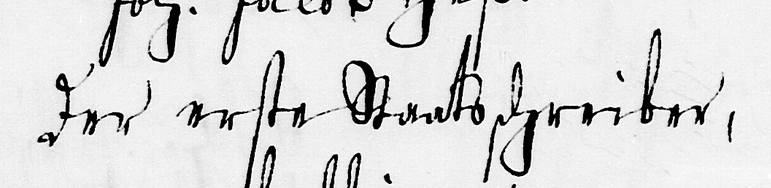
Der erste Staatsschreiber,
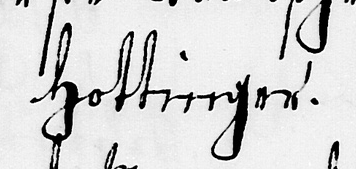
Hottinger.
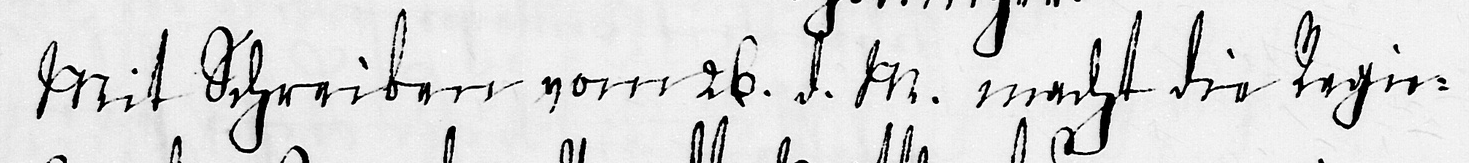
Mit Schreiben vom 26. d. M. macht die Regie¬
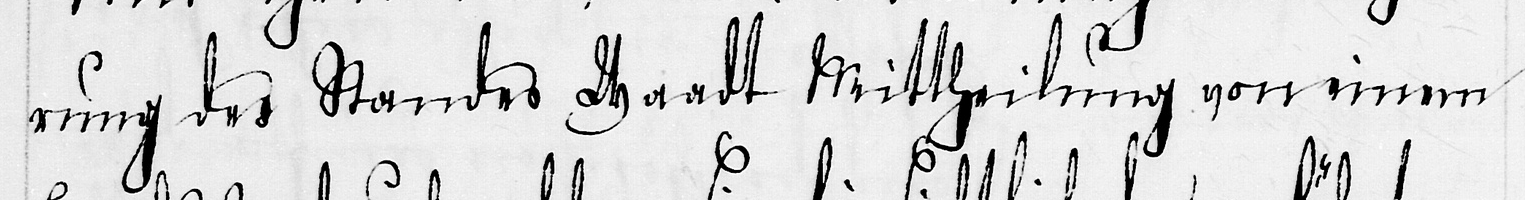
rung des Standes Waadt Mittheilung von einem
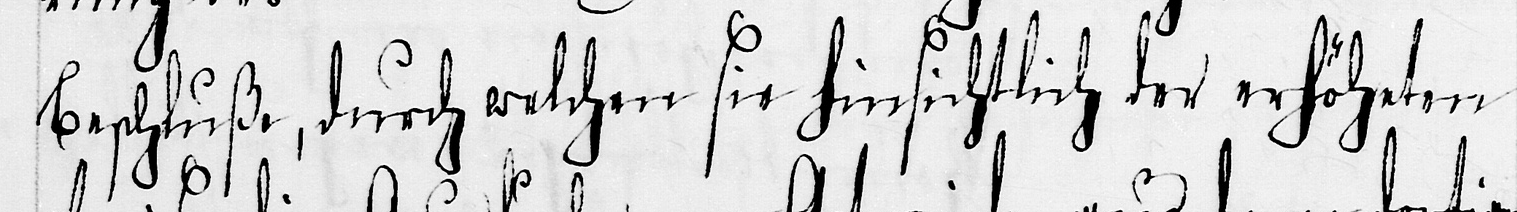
Beschluße, durch welchen sie hinsichtlich der erhöheten
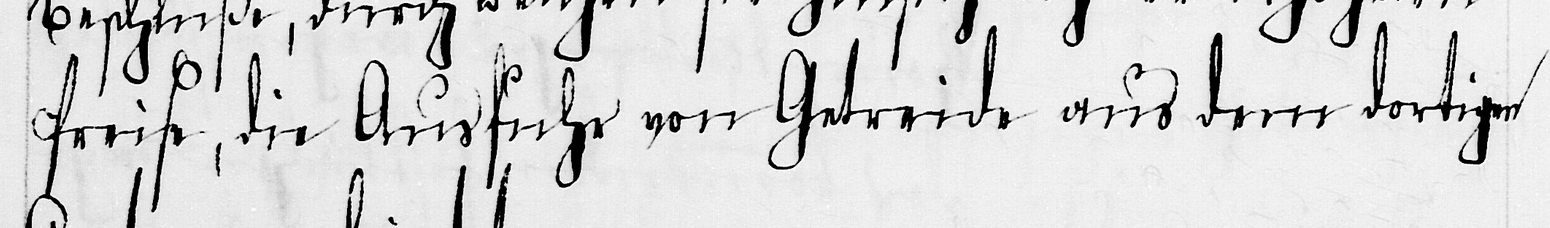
Preise, die Ausfuhr von Getreide aus dem dortigen
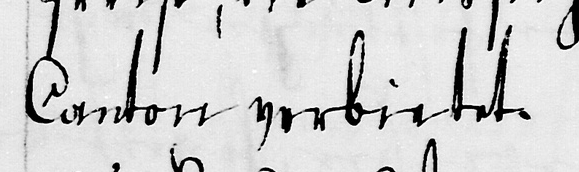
Canton verbietet.
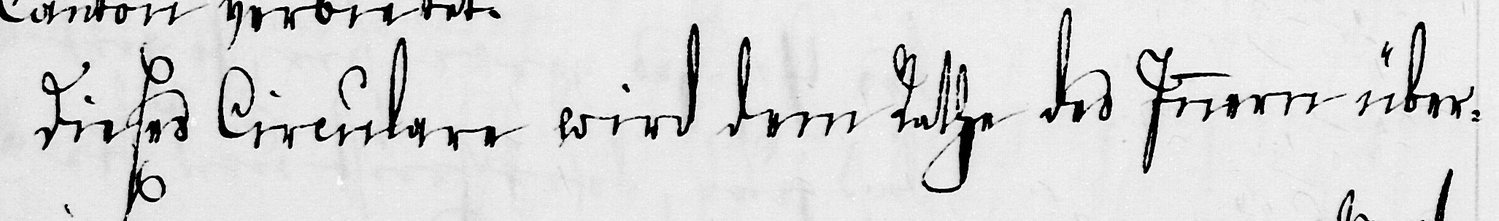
Dieses Circulare wird dem Rathe des Innern über¬
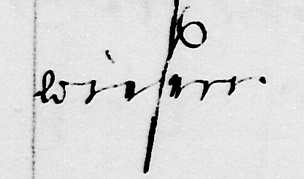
wiesen.
